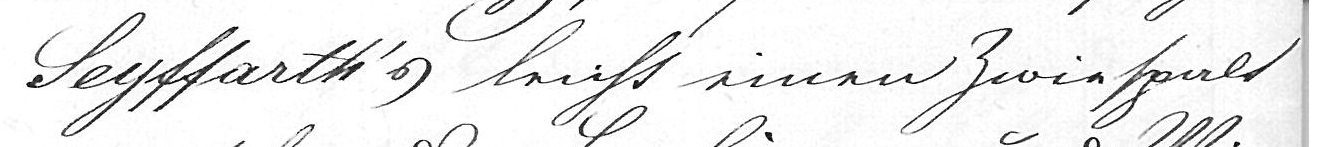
Seyffarth's leicht einen Zwiespalt
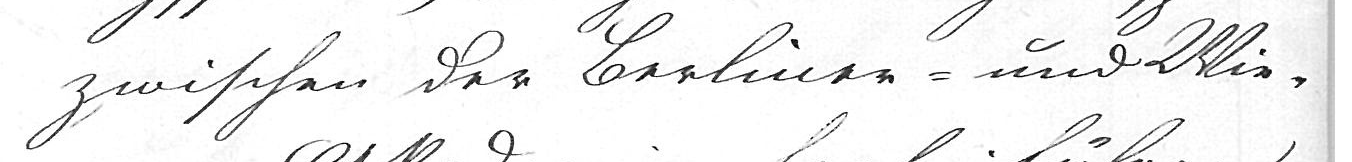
zwischen der Berliner- und Wie-
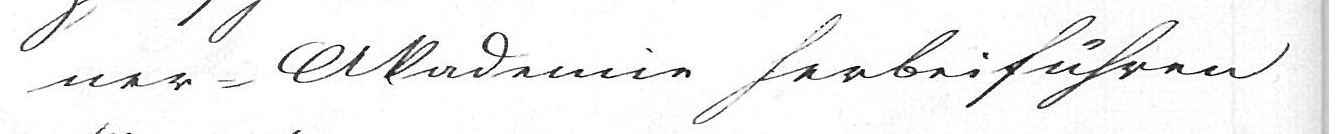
ner-Akademie herbeiführen
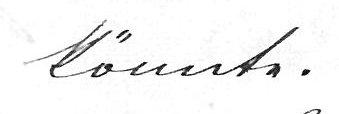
könnte.
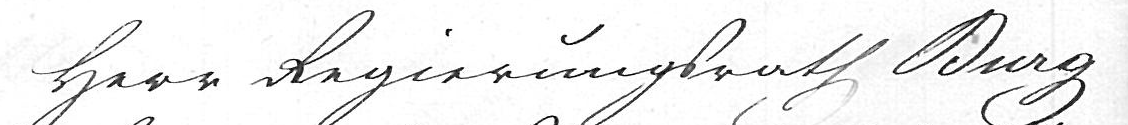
Herr Regierungsrath Burg
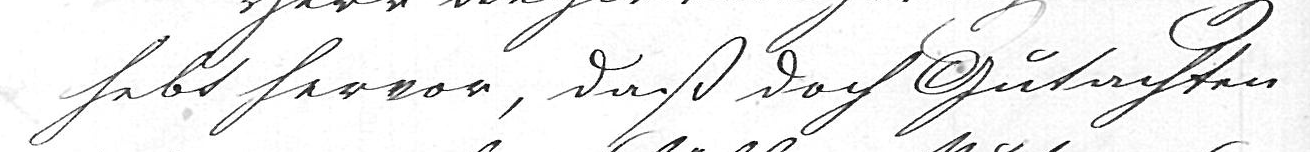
hebt hervor, daß doch Gutachten
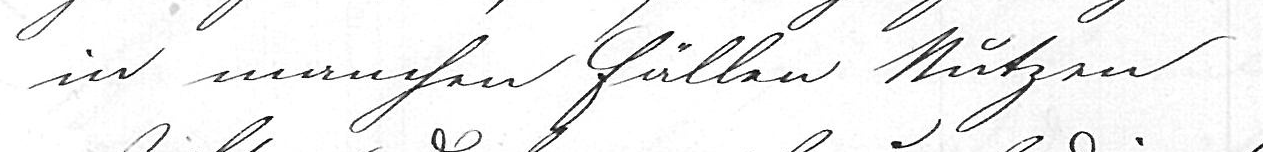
in machen Fällen Nutzen
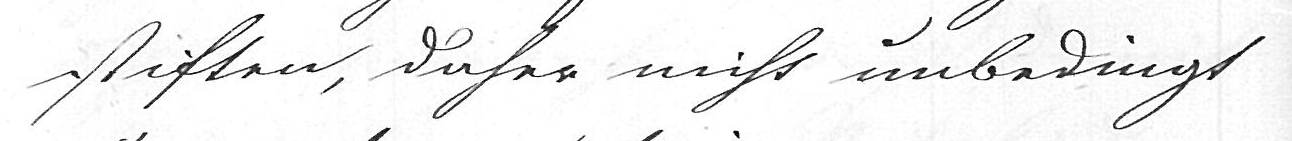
stiften, daher nicht unbedingt
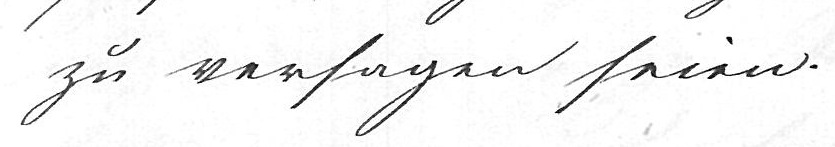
zu versagen seien.
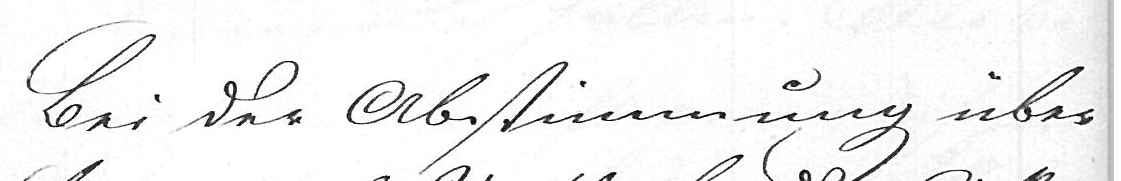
Bei der Abstimmung über
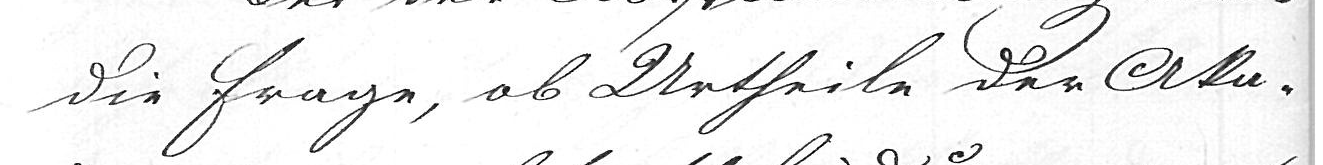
die Frage, ob Urtheile der Aka-
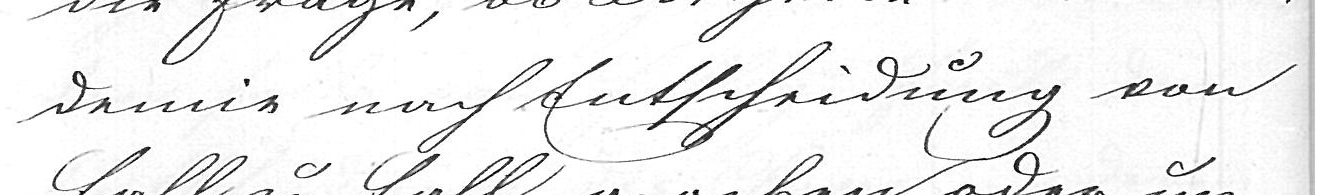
demie nach Entscheidung von
